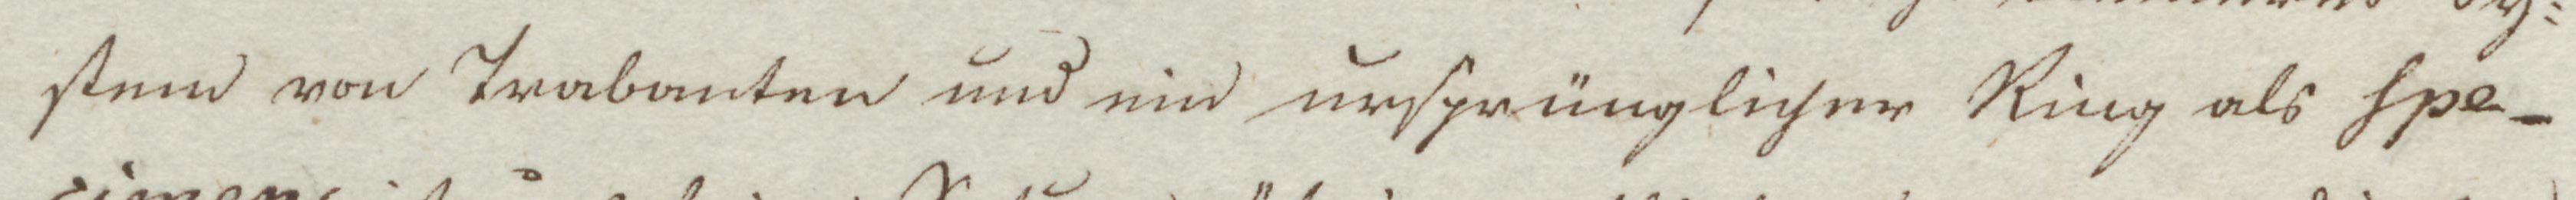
stem von Trabanten und ein ursprünglicher Ring als spe-
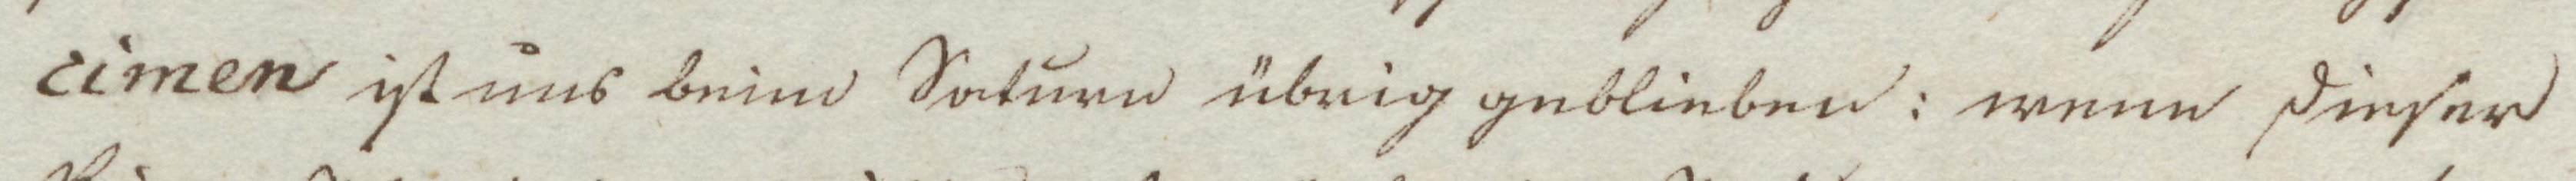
cimen ist uns beim Saturn übrig geblieben: wenn dieser
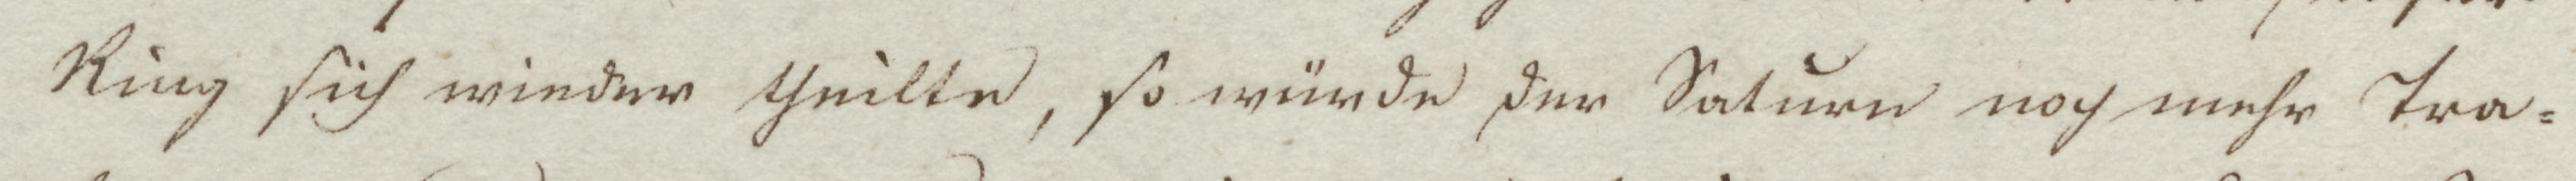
Ring sich wieder theilte, so würde der Saturn noch mehr Tra-
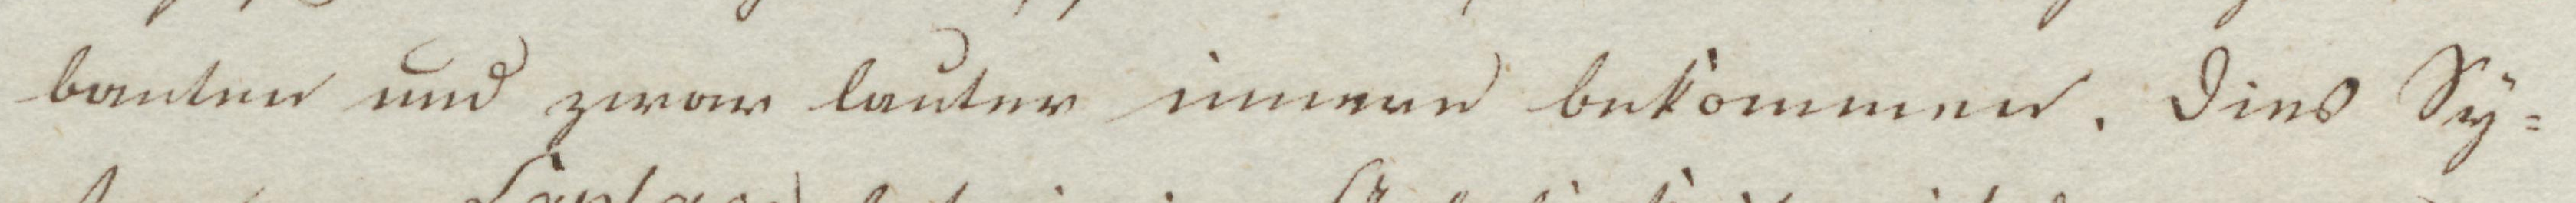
banten und zwar lauter innere bekommen. Dies Sÿ-
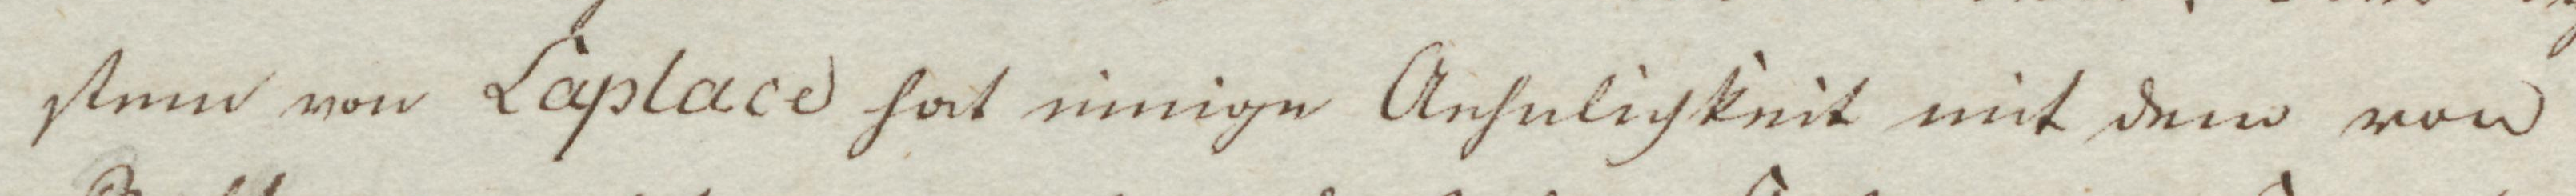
stem von Laplace hat einige Aehnlichkeit mit dem von
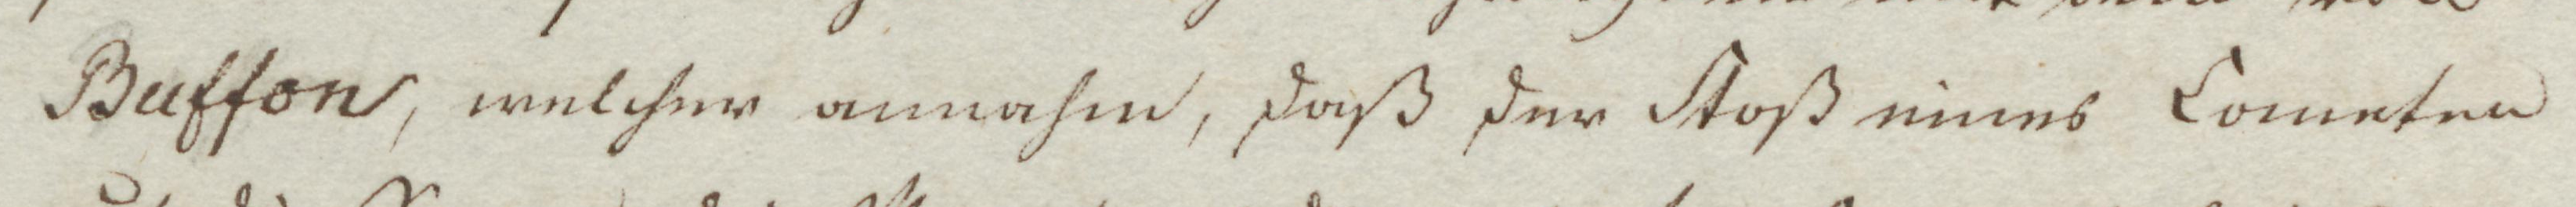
Buffon, welcher annahm, daß der Stoß eines Cometen
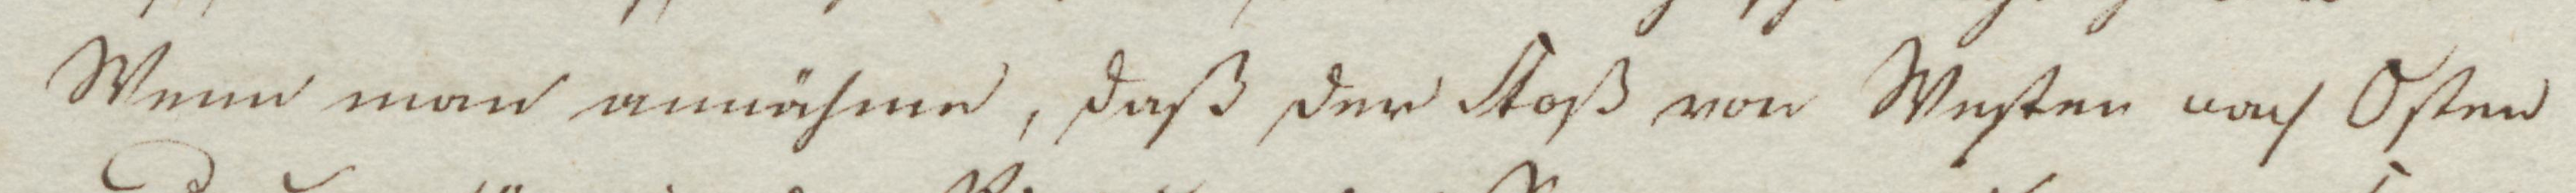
Wenn man annähme, daß der Stoß von Westen nach Osten
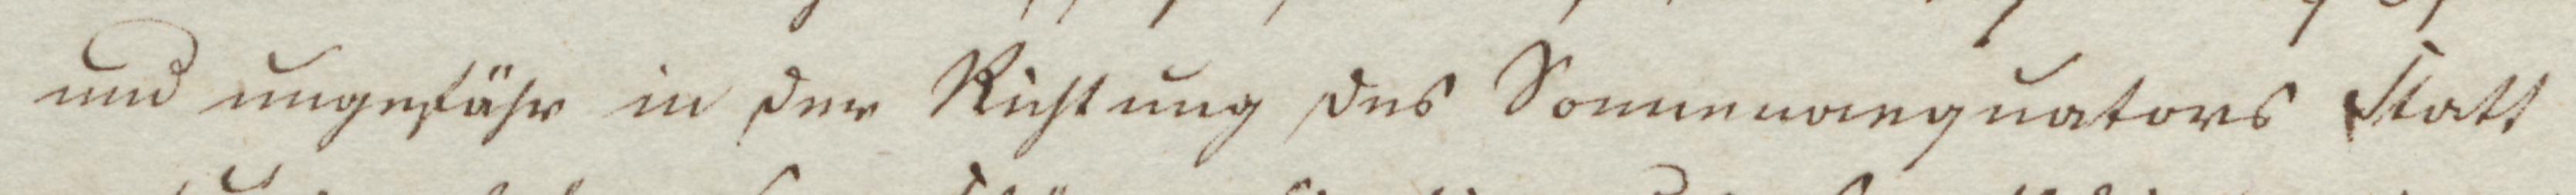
und ungefähr in der Richtung des Sonnenaequators Statt
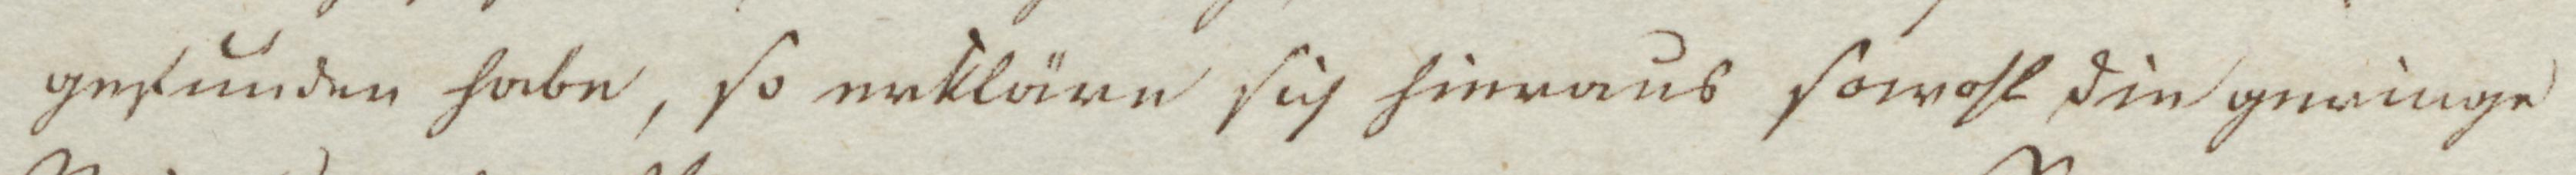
gefunden habe, so erkläre sich hieraus sowohl die geringe
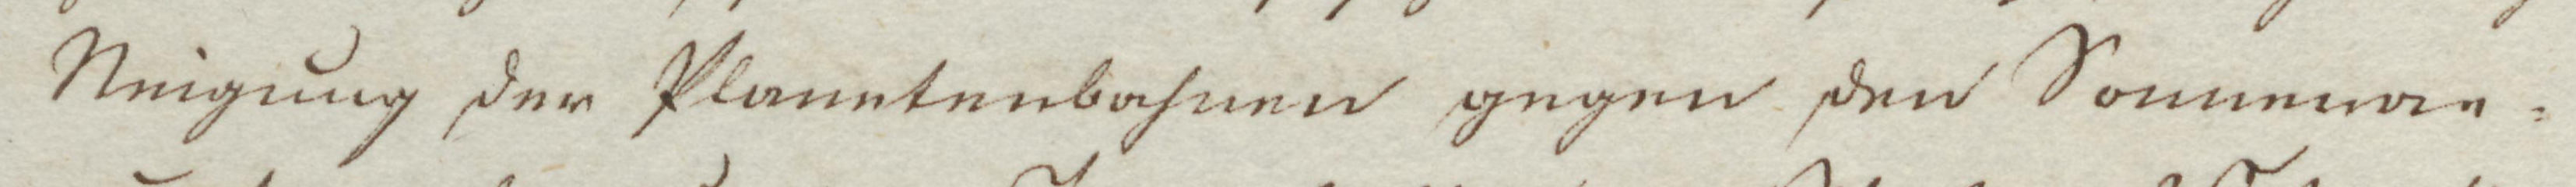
Neigung der Planetenbahnen gegen den Sonnenae-
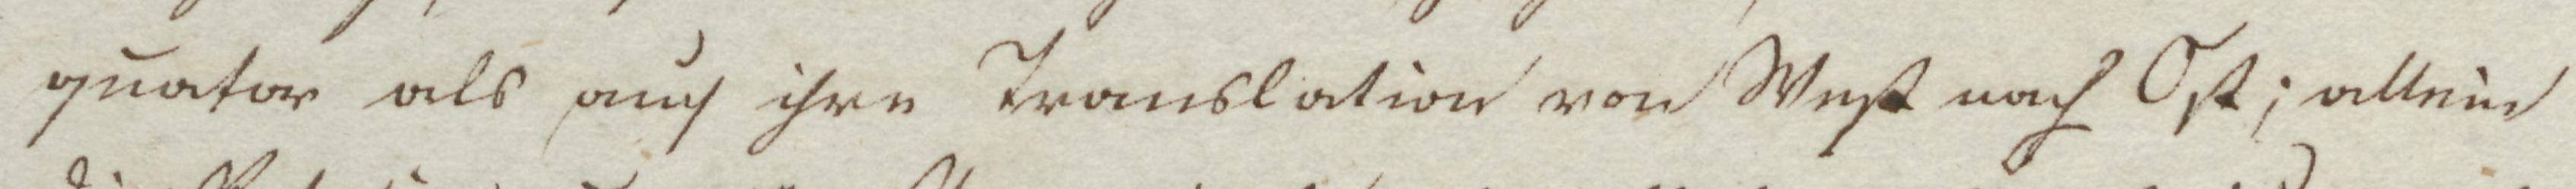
quator als auch ihre Translation von West nach Ost; allein
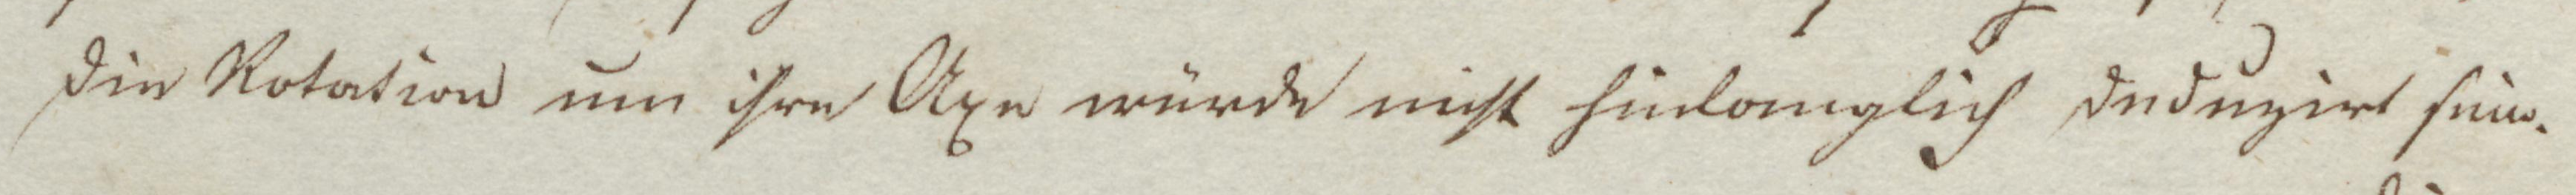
die Rotation um ihre Axe würde nicht hinlänglich deduzirt sein.
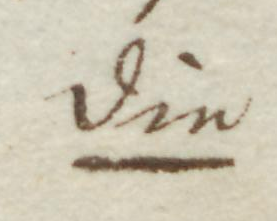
Dies
